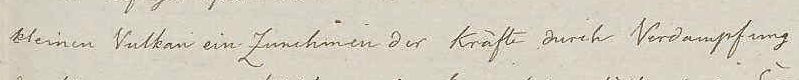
kleinen Vulkan ein Zunehmen der Kräfte durch Verdampfung
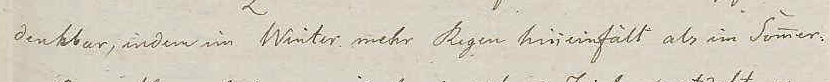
denkbar, indem im Winter mehr Regen hineinfält als im Som̃er.
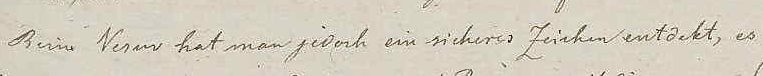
Beim Vesuv hat man jedoch ein sicheres Zeichen entdekt, es
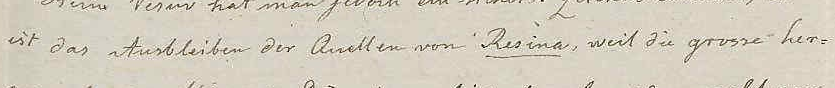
ist das Ausbleiben der Quellen von Resina, weil die grosse her-
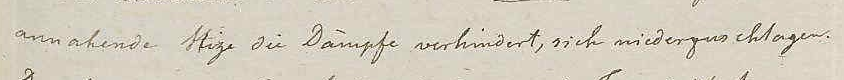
annahende Hize die Dämpfe verhindert, sich niederzuschlagen.
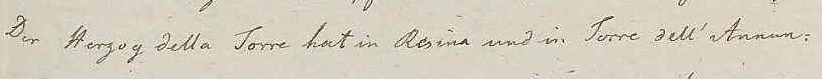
Der Herzog della Torre hat in Resina und in Torre dell' Annun-
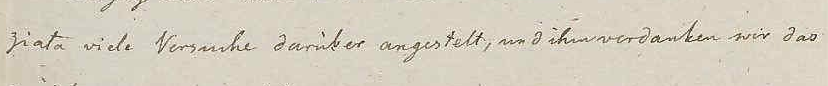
ziata viele Versuche darüber angestelt, und ihm verdanken wir das
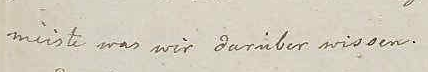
meiste was wir darüber wissen.
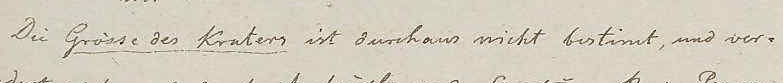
Die Grösse des Kraters ist durchaus nicht bestimt, und ver-
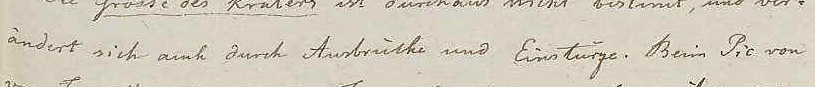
ändert sich auch durch Ausbrüche und Einstürze. Beim Pic von
